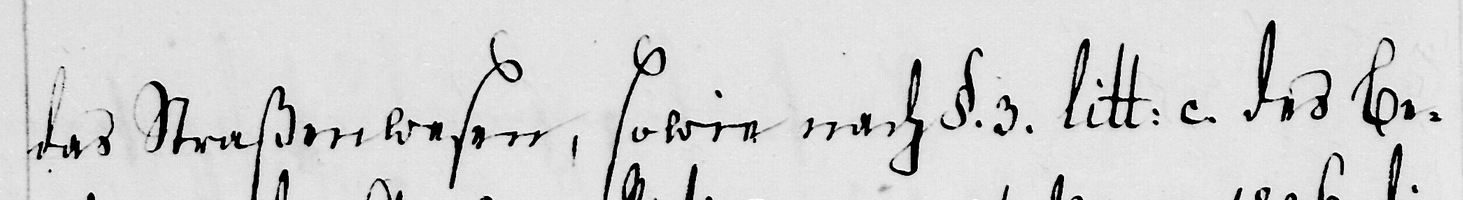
das Straßenwesen, sowie nach §. 3. litt. c. des Be¬
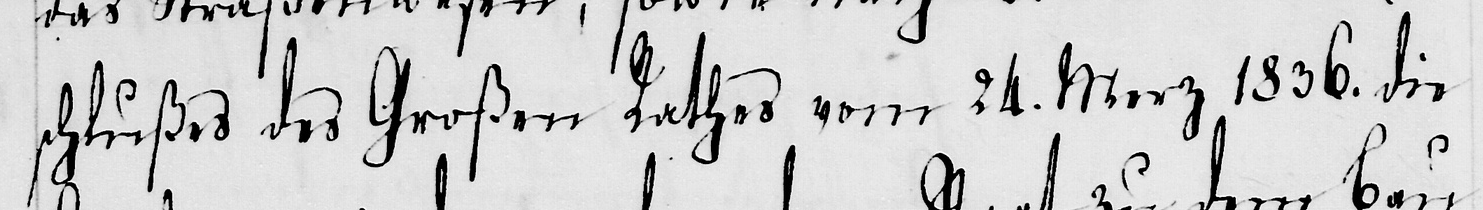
schlußes des Großen Rathes vom 24. Merz 1836. die
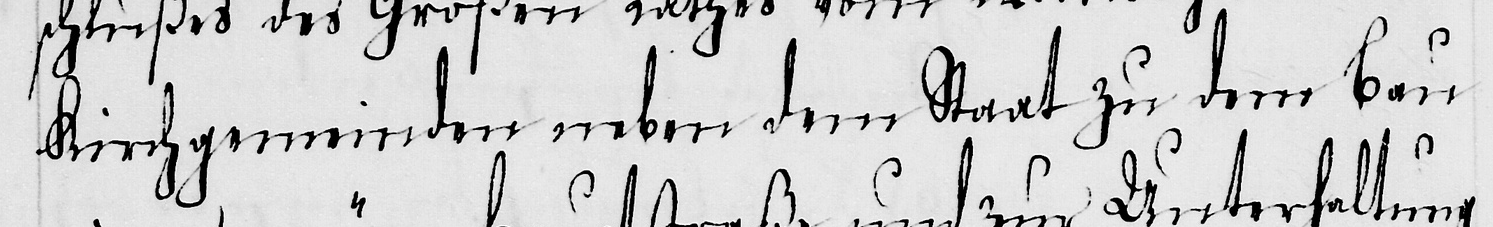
Kirchgemeinden neben dem Staat zu dem Bau
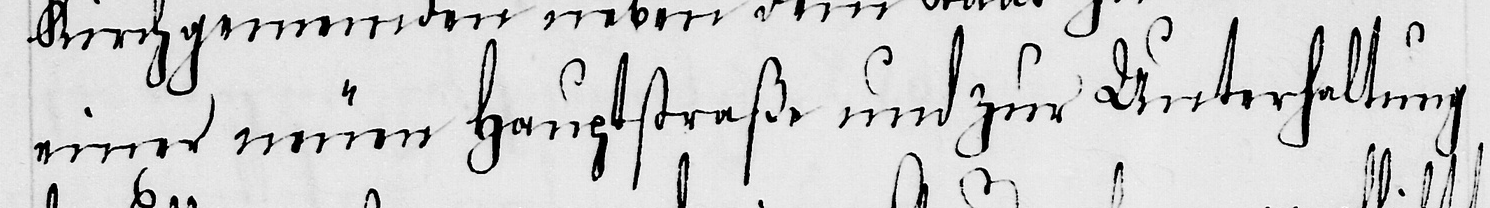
einer neuen Hauptstraße und zur Unterhaltung
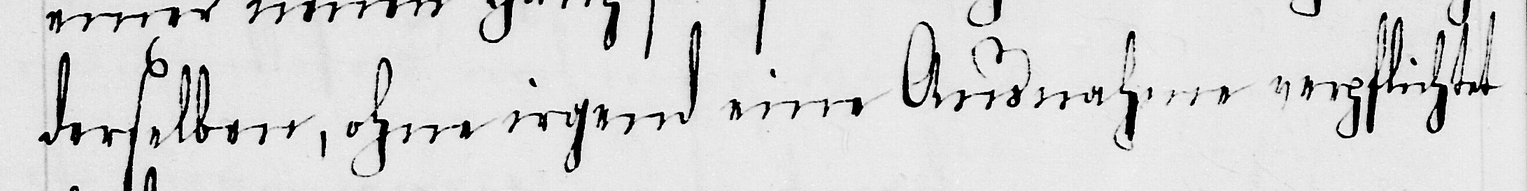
derselben, ohne irgend eine Ausnahme verpflichtet
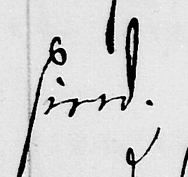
sind.
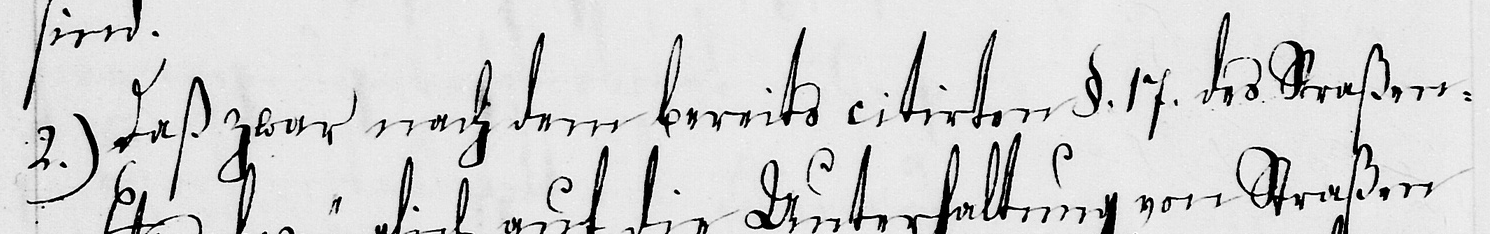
2.) Daß zwar nach dem bereits citirten §. 17. des Straßen¬
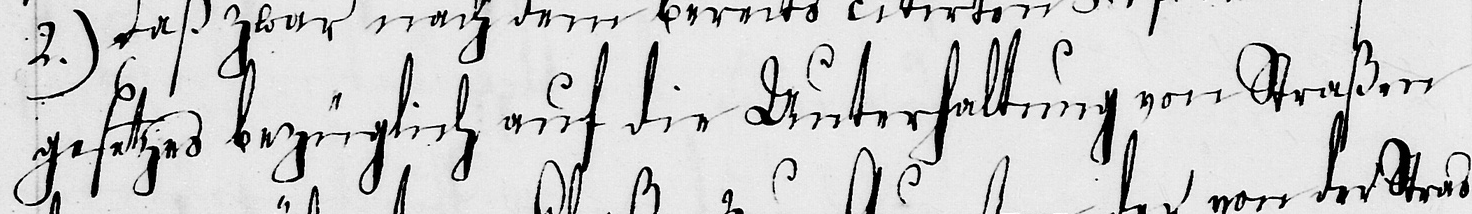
gesetzes bezüglich auf die Unterhaltung von Straßen
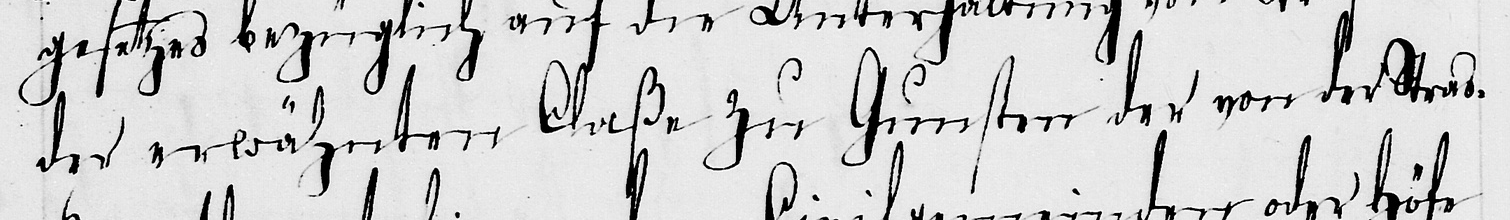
der erwähnten Claße zu Gunsten der von der Stras¬
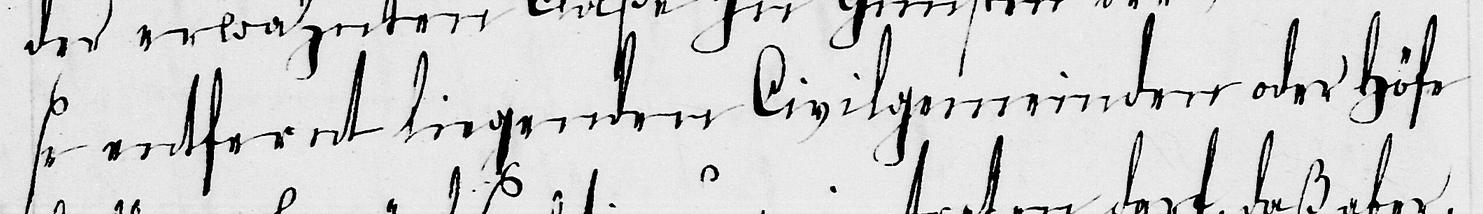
se entfernt liegenden Civilgemeinden oder Höfe
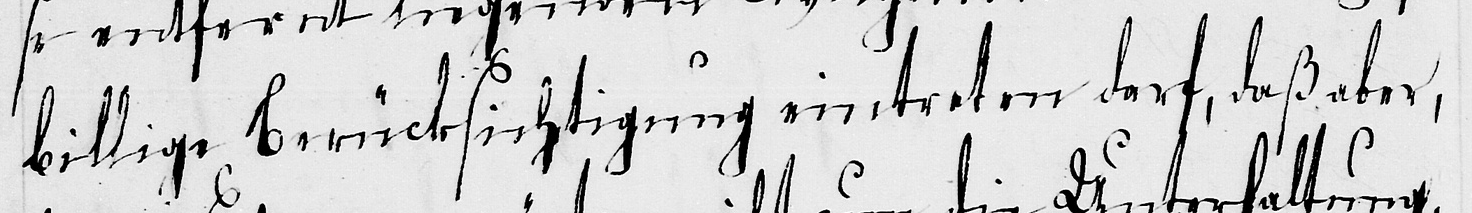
billige Berücksichtigung eintreten darf, daß aber,
